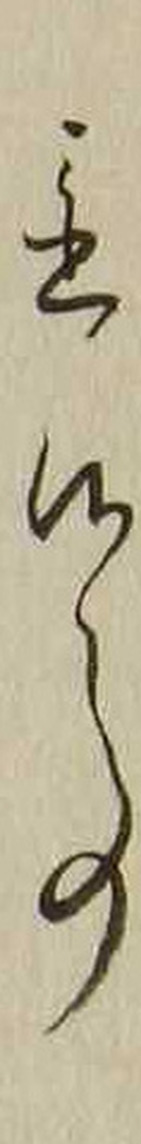置候事
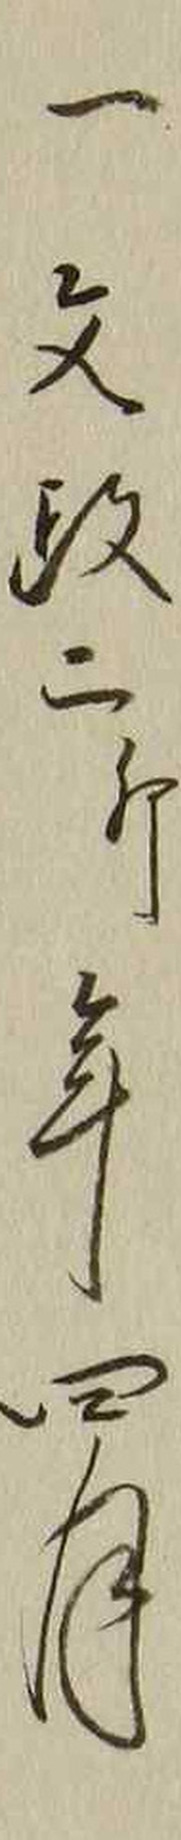一文政二卯年四月
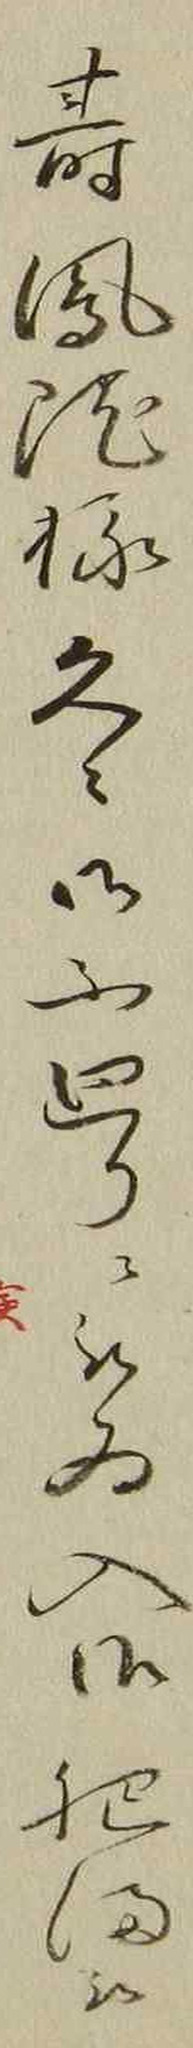寿鳳院様久々御不廻りニ被為入御肥満被
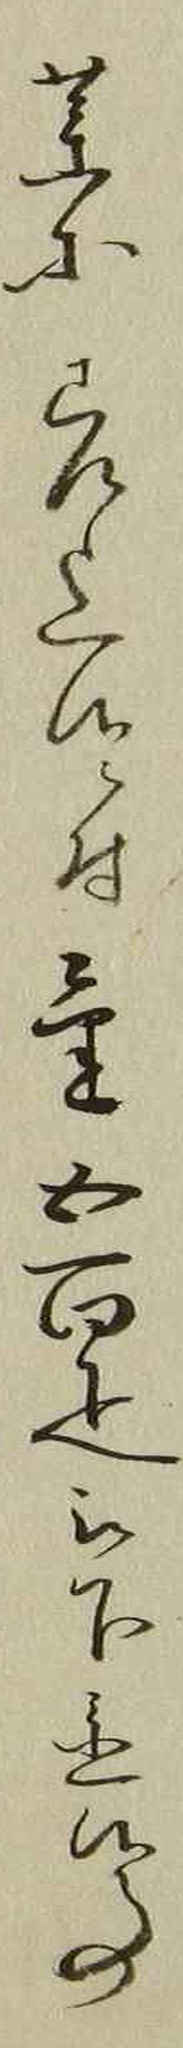薬等差上候ニ付金五百疋被下置候事
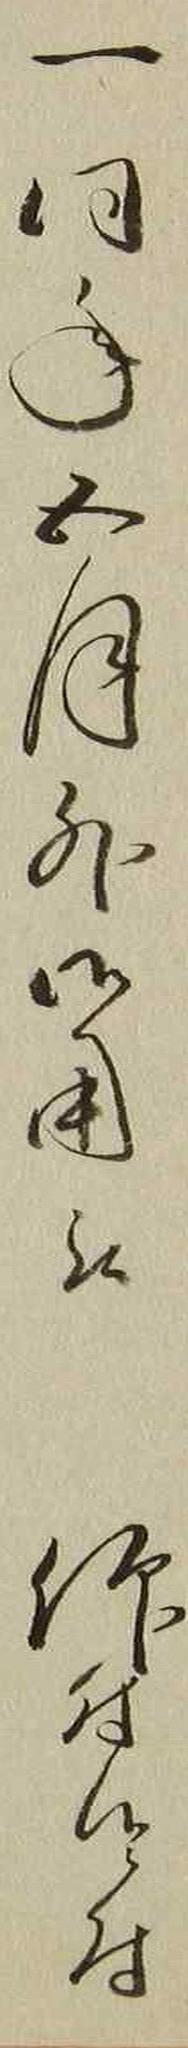一同年五月外御用被仰付候ニ付
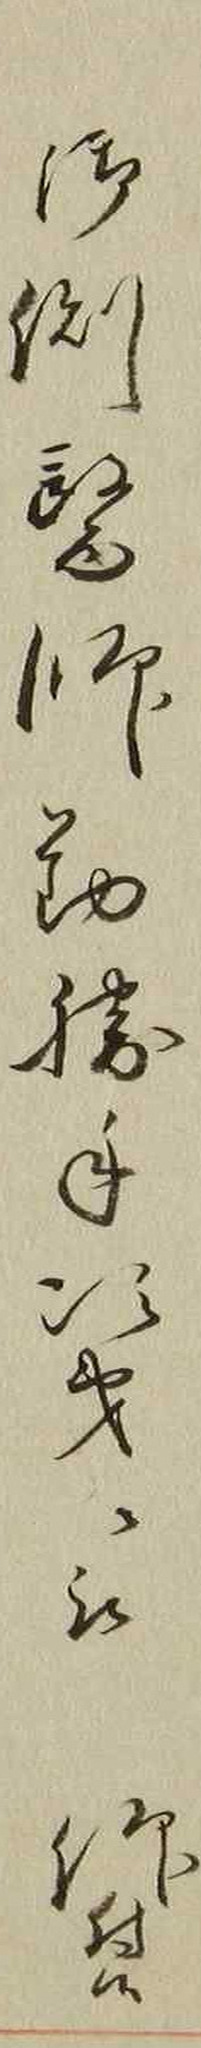御側医師勤勝手次第ニ被仰付候
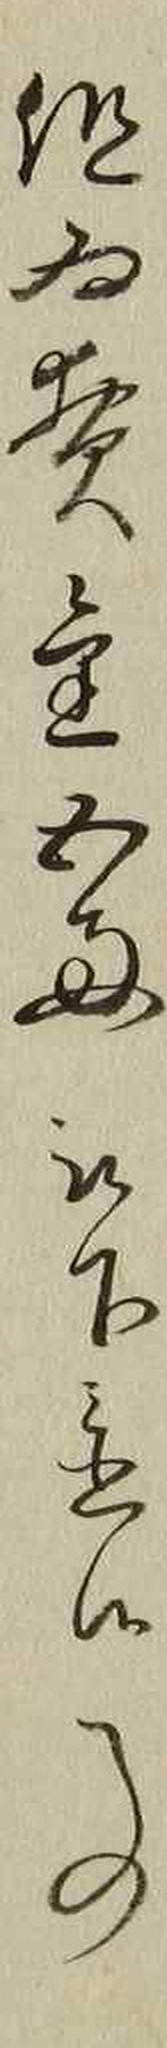但為費金五両被下置候事
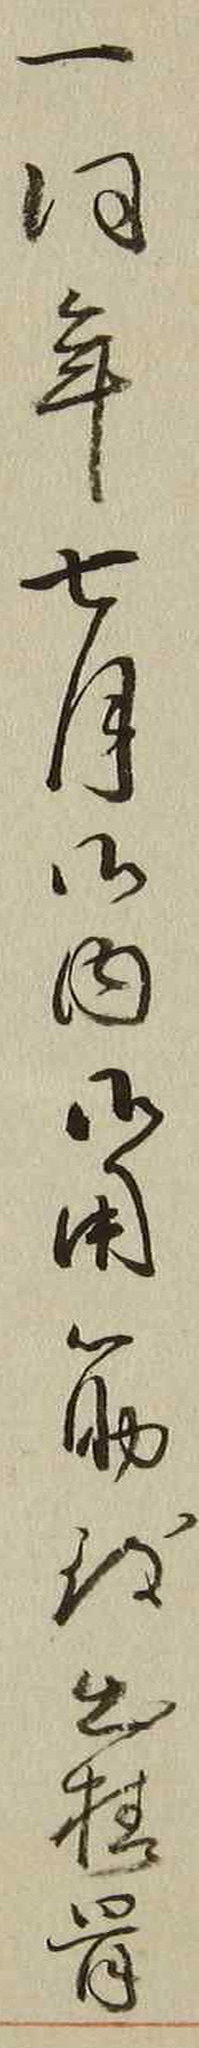一同年七月御内御用筋致出精骨
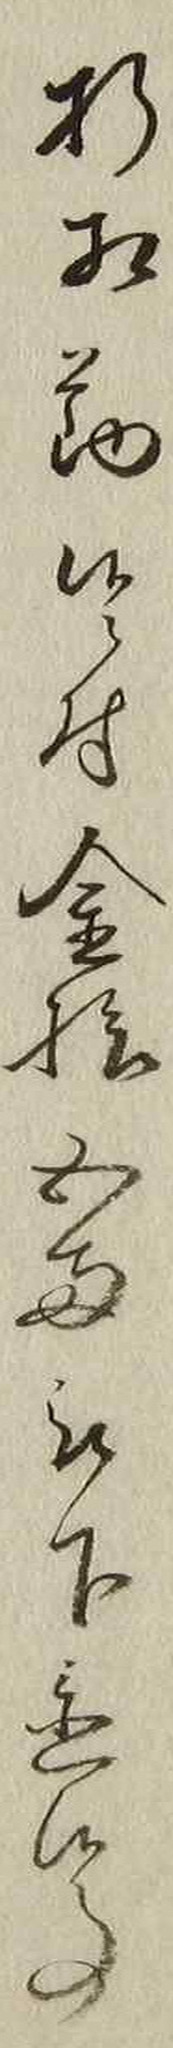折相勤候ニ付金拾五両被下置候事
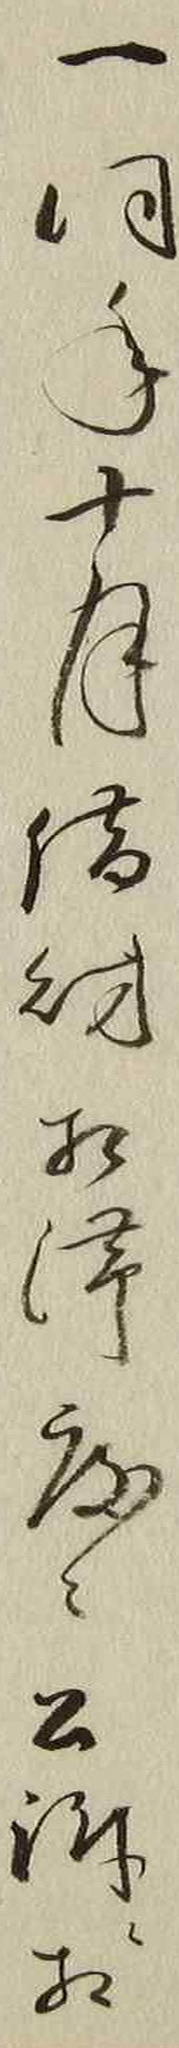一同年十月借財相滞度々公訴ニ相
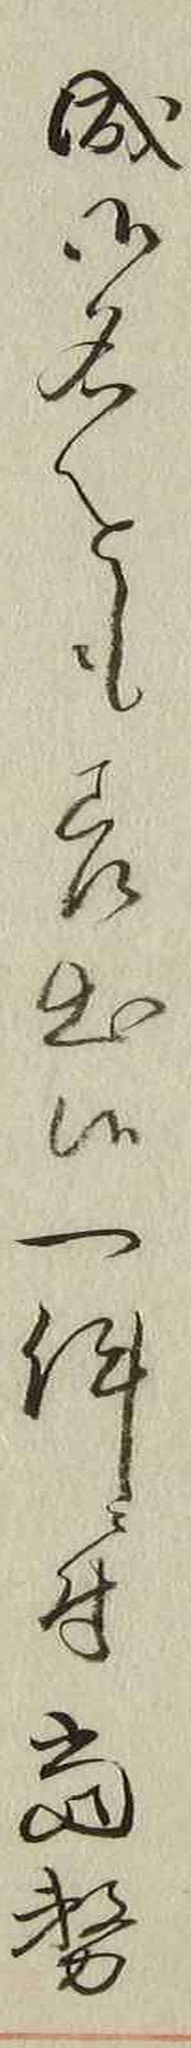成御名をも差出候一件ニ付当務
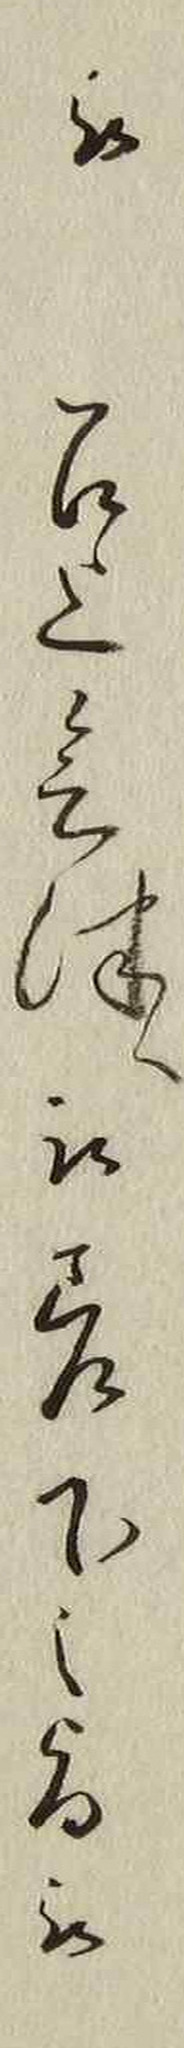被召上会津へ被差下之旨被
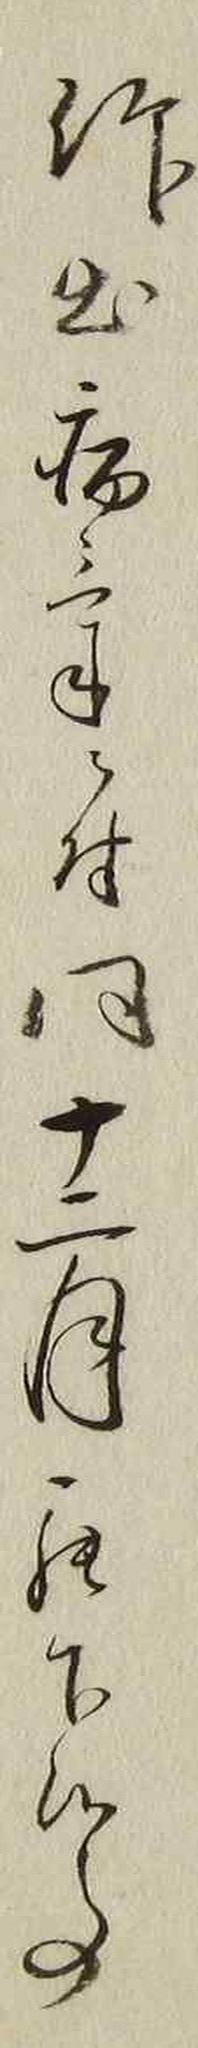仰出病気ニ付同十二月罷下候事
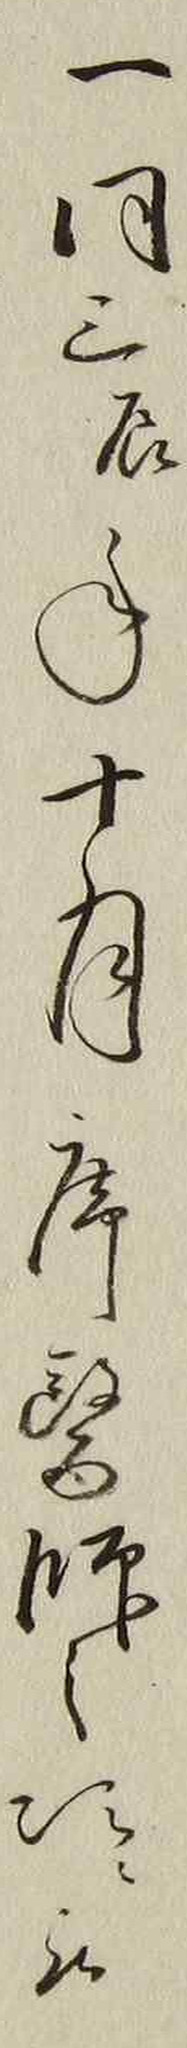一同三辰年十月席医師之次ニ被
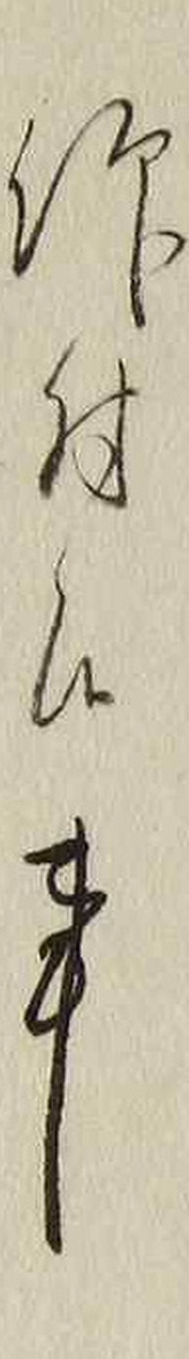仰付候事
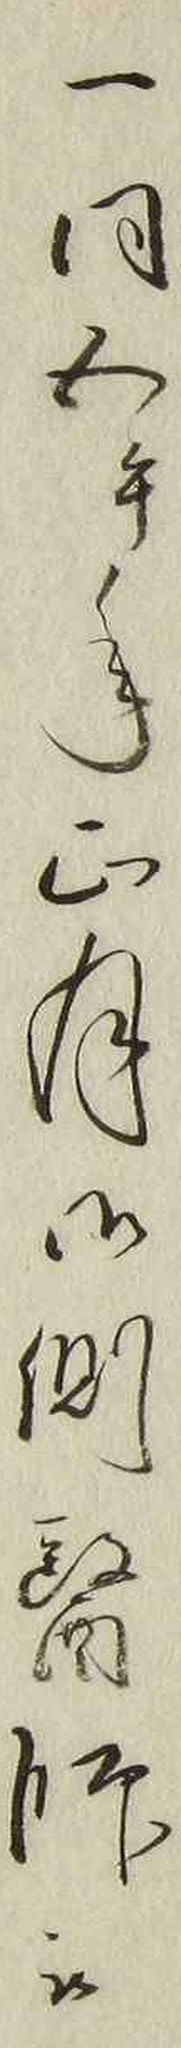一同五午年正月御側医師被
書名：諸士系譜　巻之8　い之部8
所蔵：会津若松市立会津図書館
